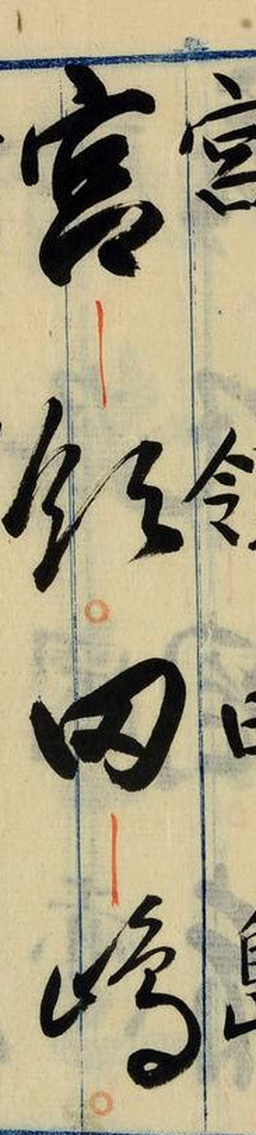宮領田島
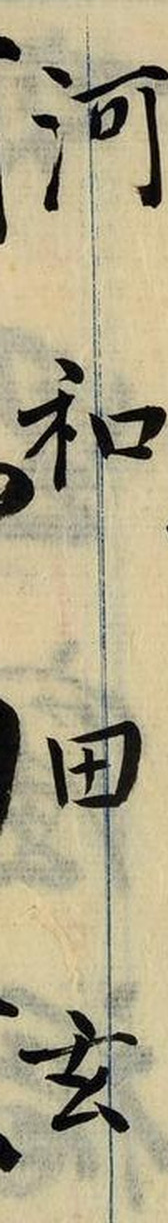河和田玄
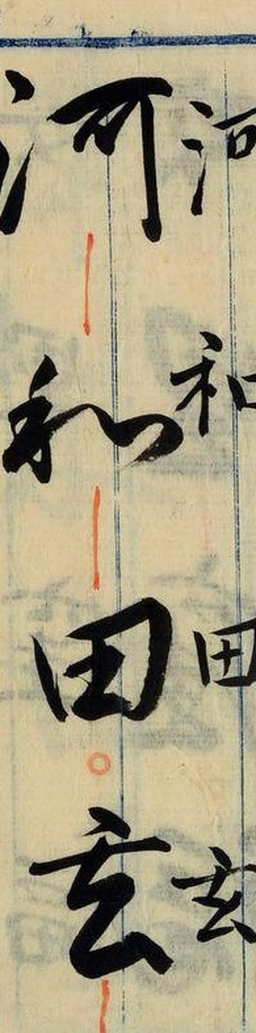河和田玄

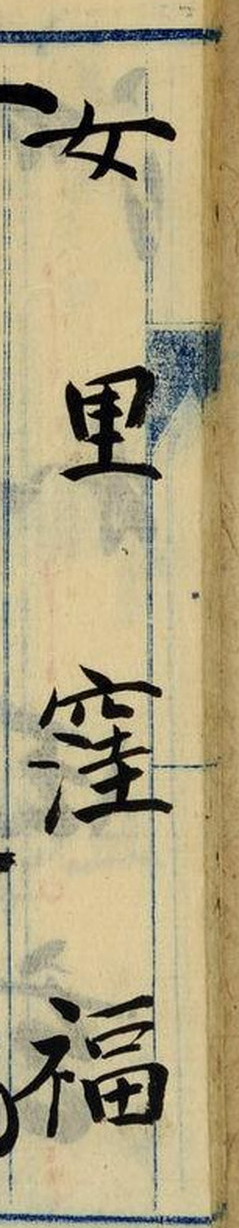女里窪福
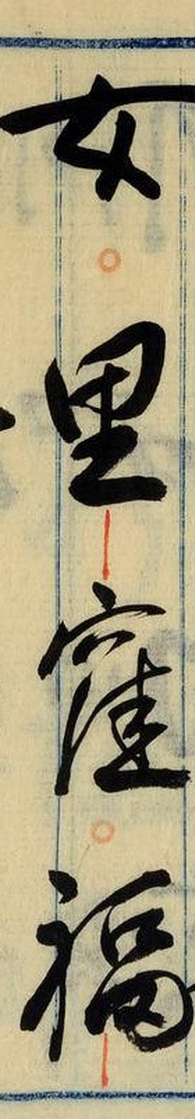女里窪福
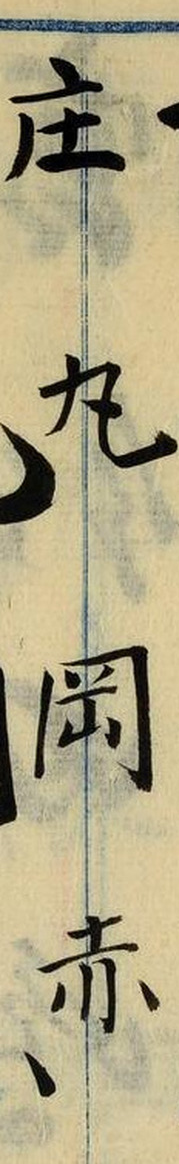庄丸岡赤
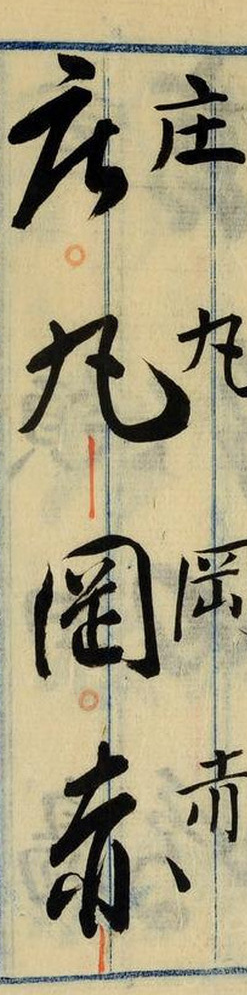庄丸岡赤
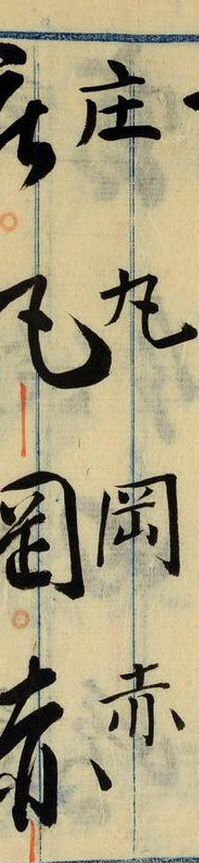庄丸岡赤
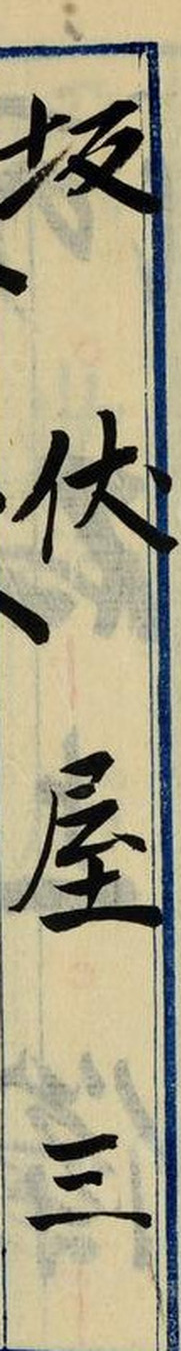坂伏屋三
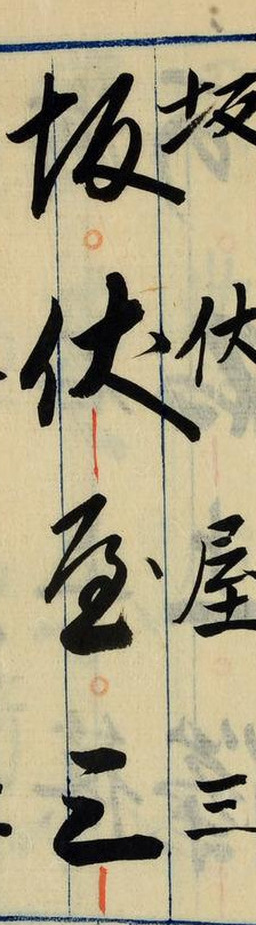坂伏屋三
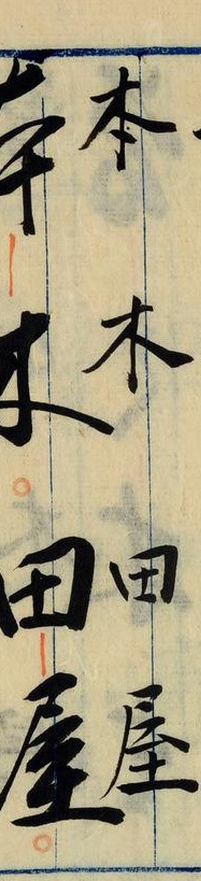本木田屋
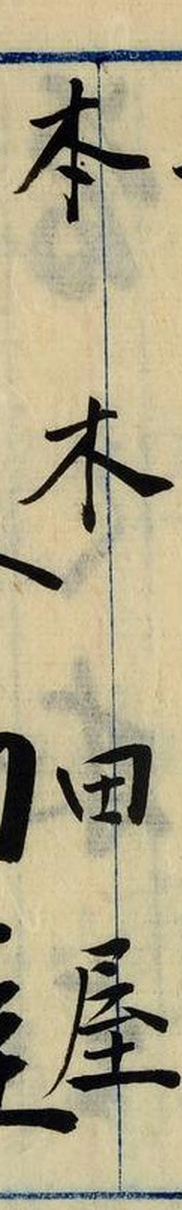本木田屋
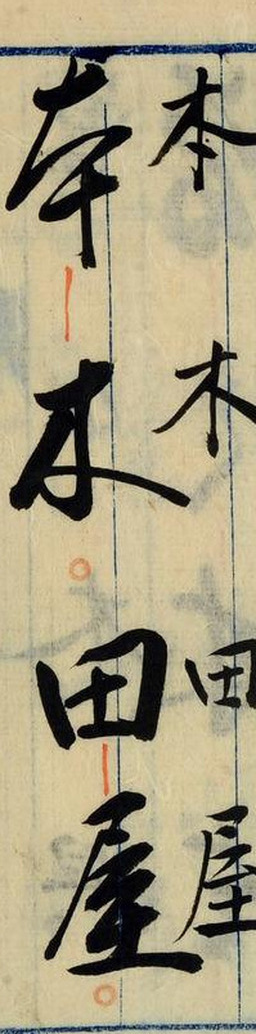本木田屋

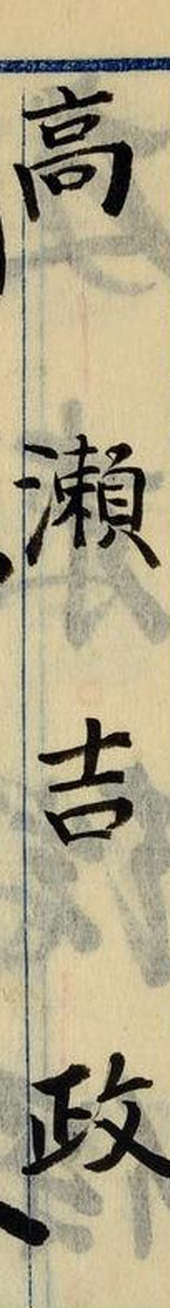高瀬吉政
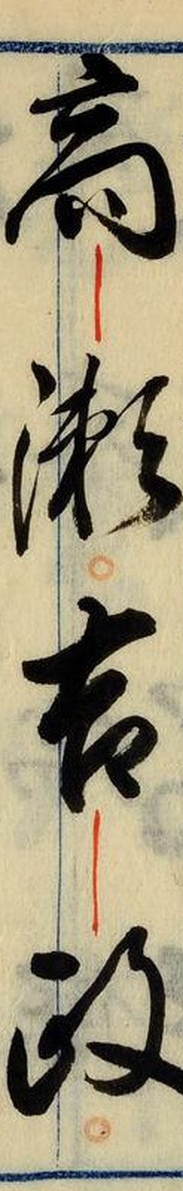高瀬吉政
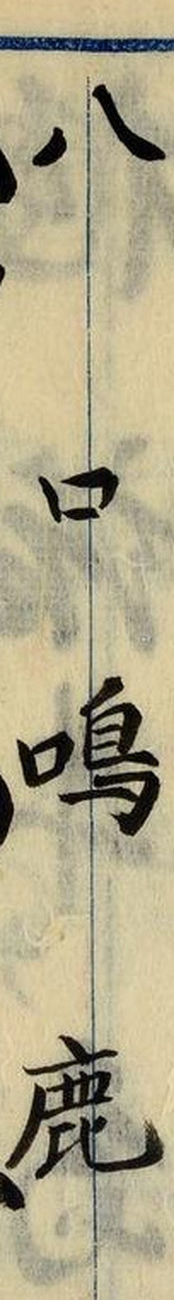八口鳴鹿
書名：村名・連語
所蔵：福井県文書館 Fukui Prefectural Archives
